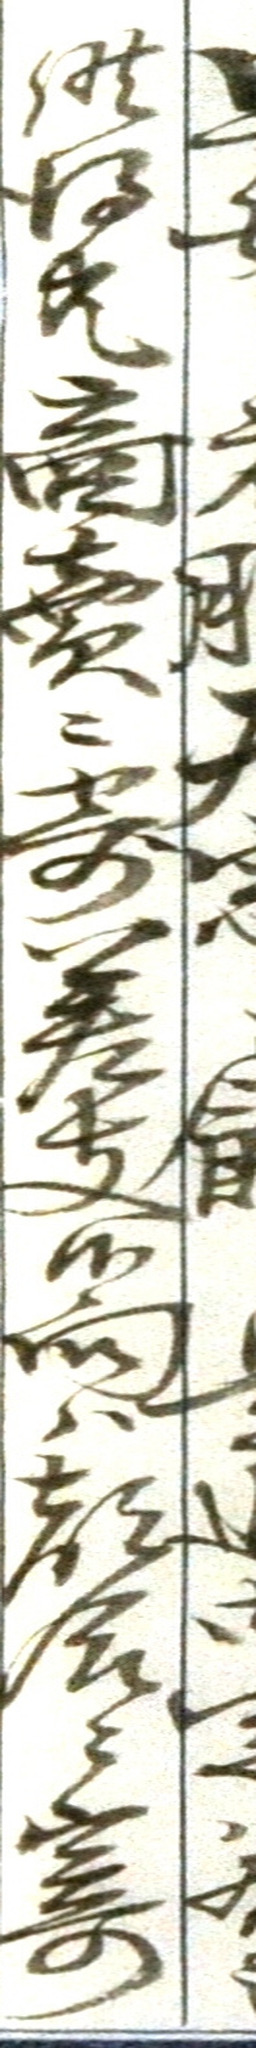候得共商売ニ寄差支候向は都合ニ寄

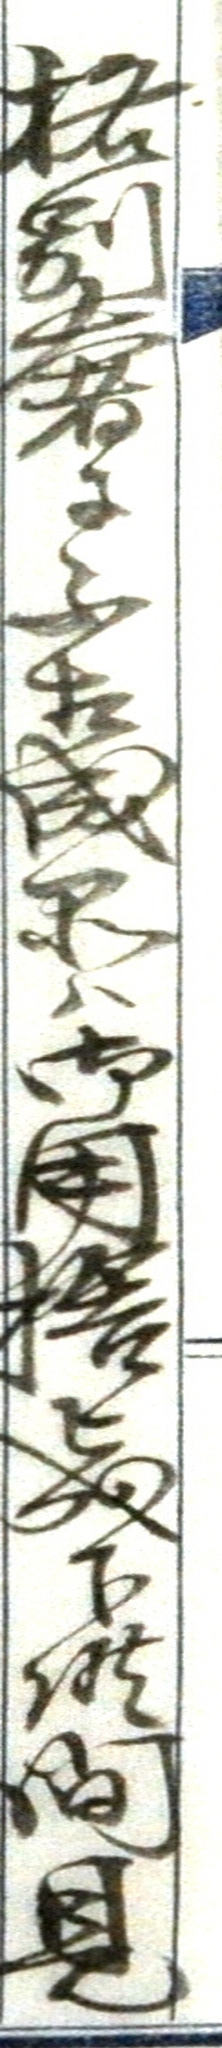格別奢に不相成品は御用捨被成下候間見
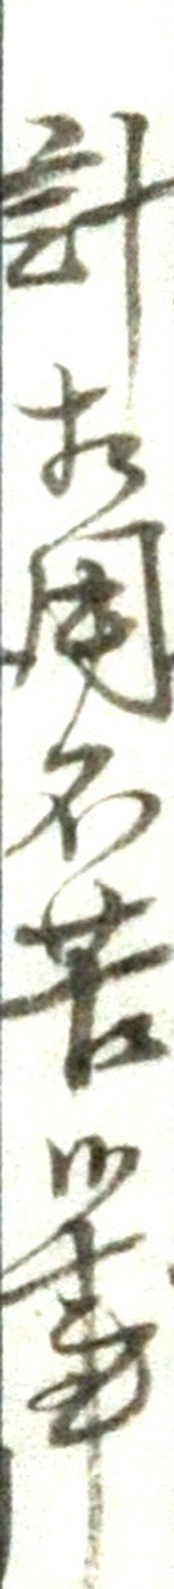計相用不苦候事
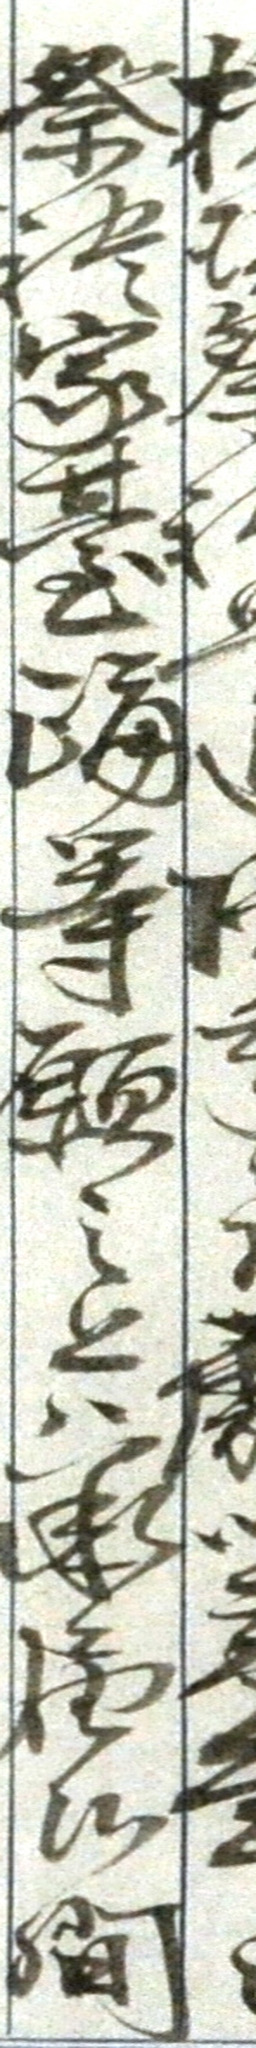祭礼家台踊等願之上は承届候間
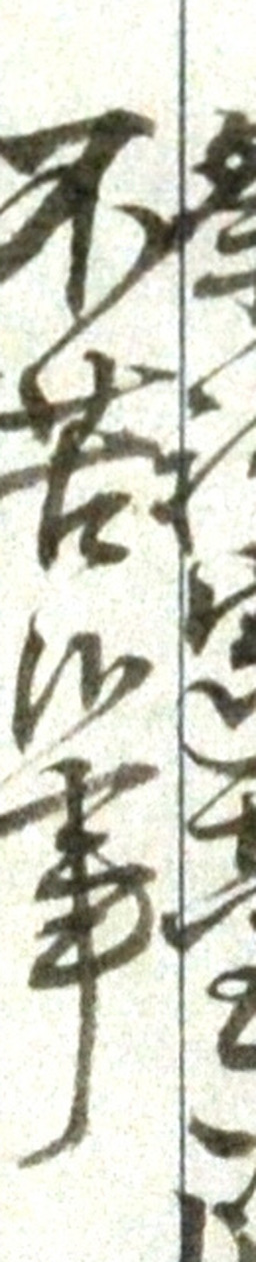不苦候事
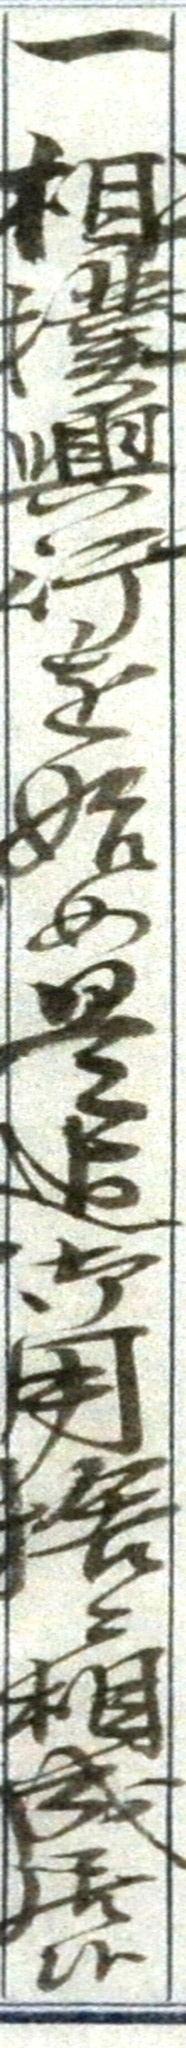一相撲興行を始め是迄御用捨ニ相成居候
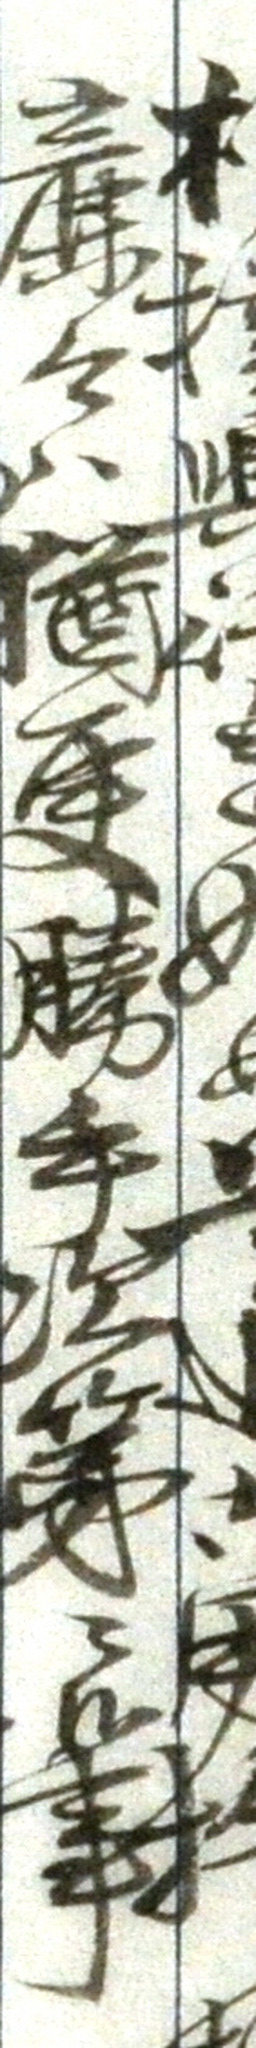廉々は猶更勝手次第ニ候事
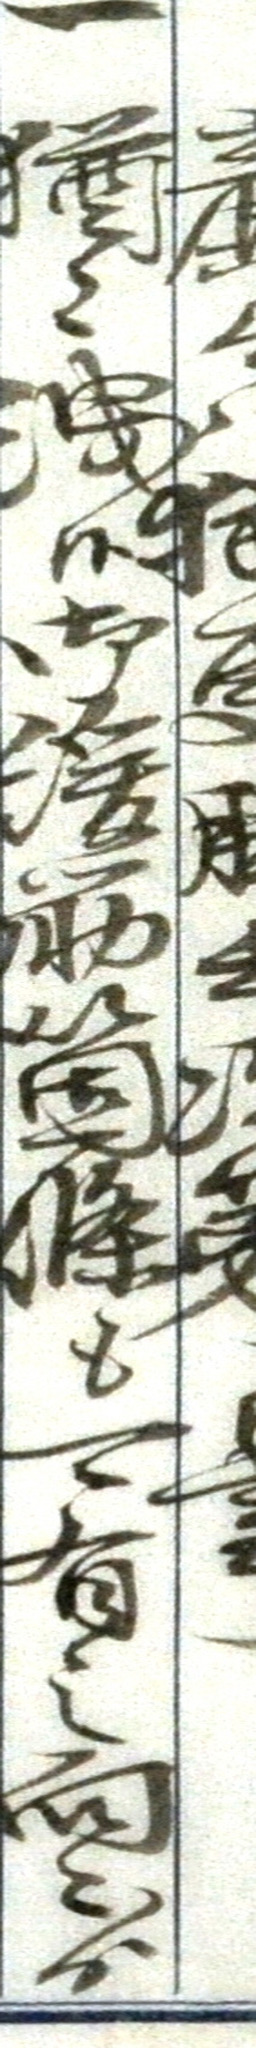一猶々洩候御緩筋箇条も可有之向々ゟ
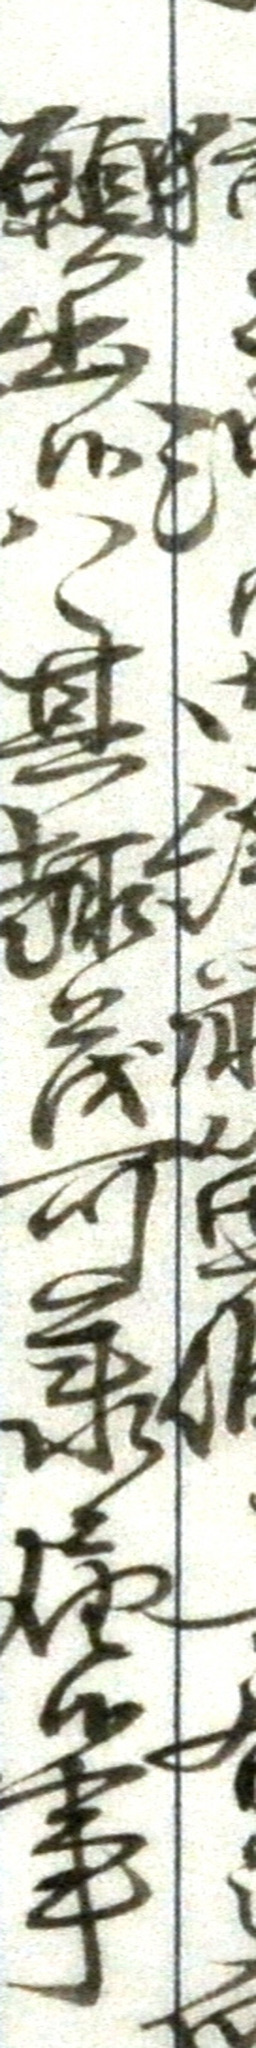願出候はゝ其趣も可承届候事
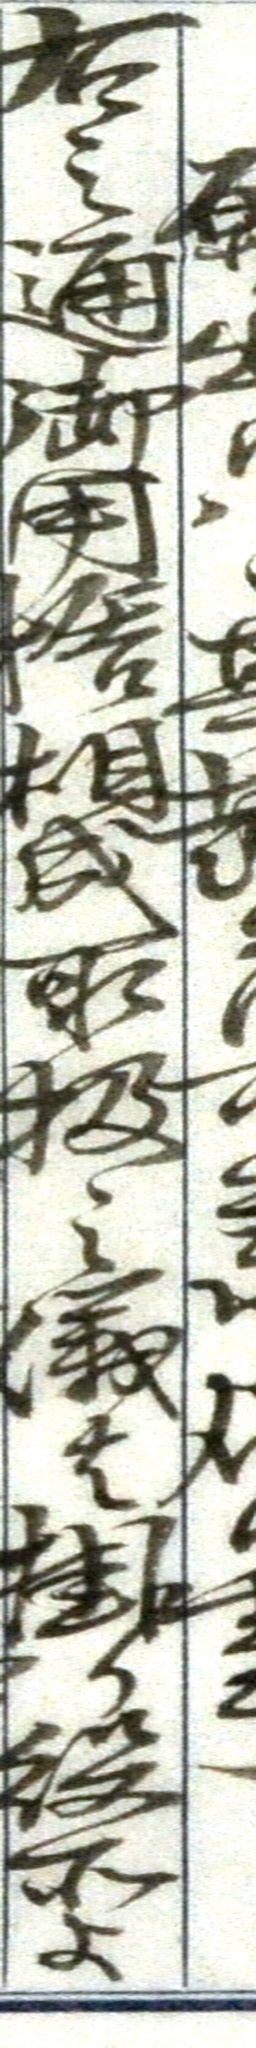右之通御用捨相成取扱之儀は掛り役所よ
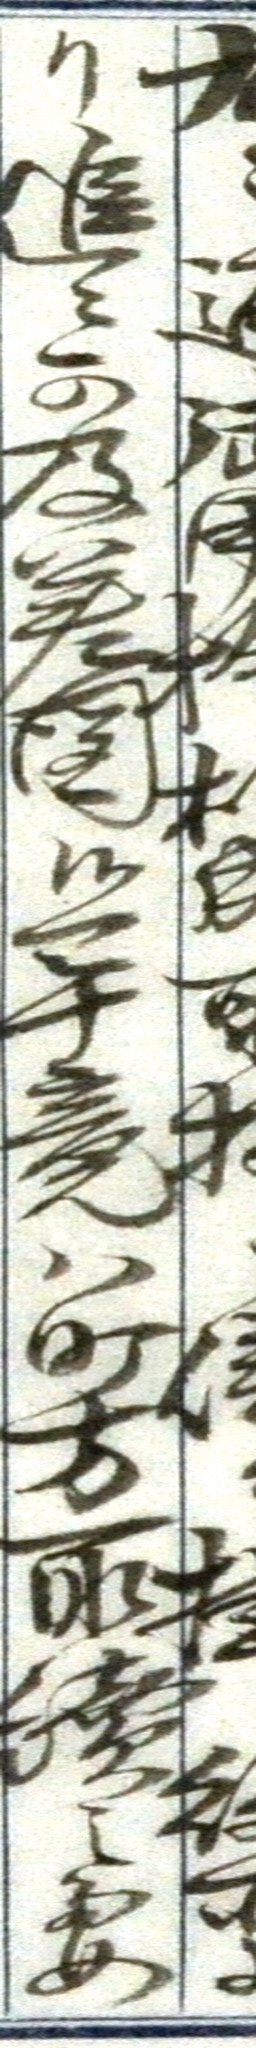り追々可及差図候畢竟は町方取続之ため
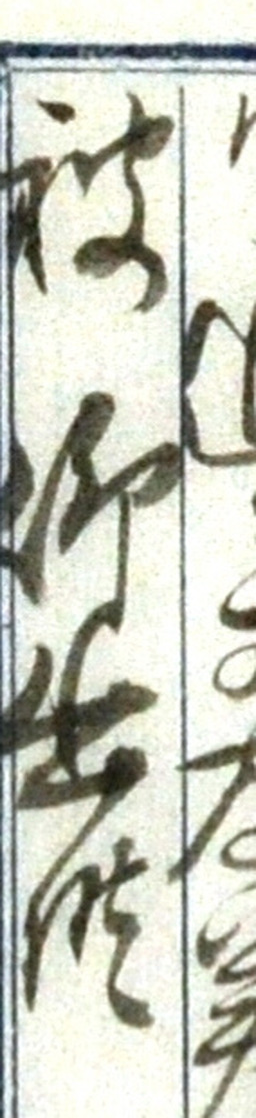被仰出候
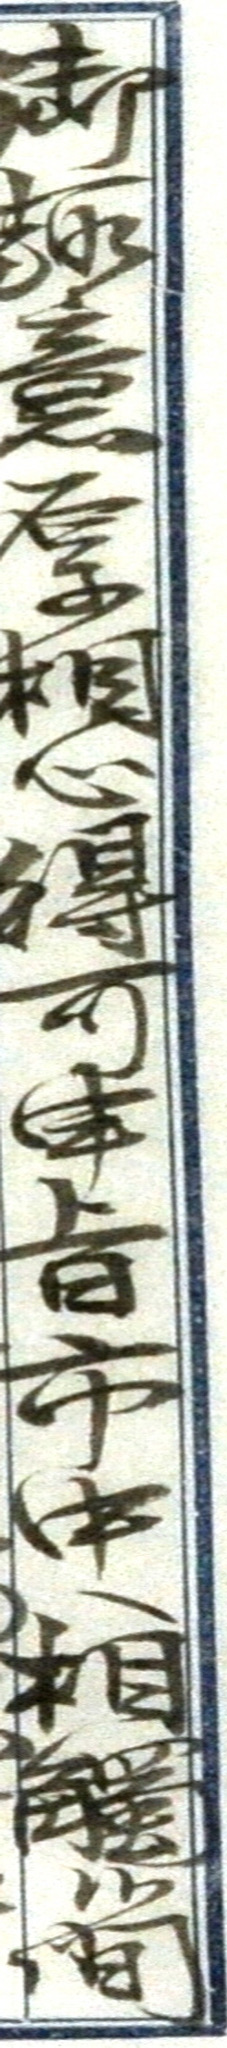御趣意厚相心得可申旨市中へ相触候間
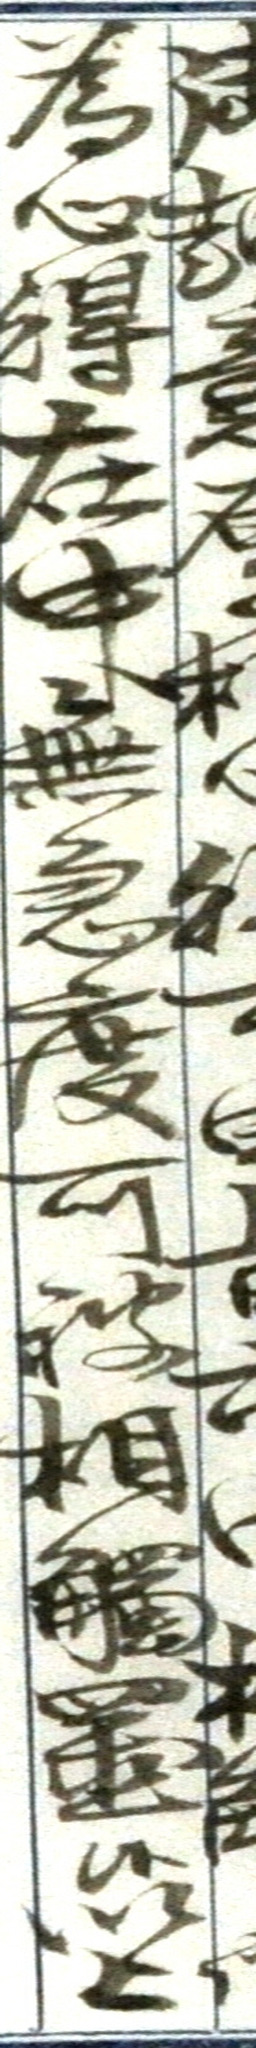為心得在中無急度可被相触置候以上
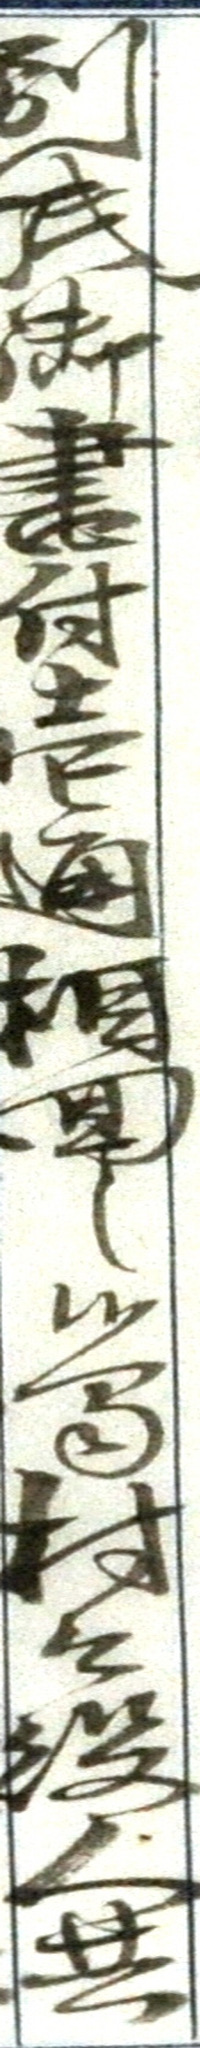別紙御書付壱通相回し候間村々役人共
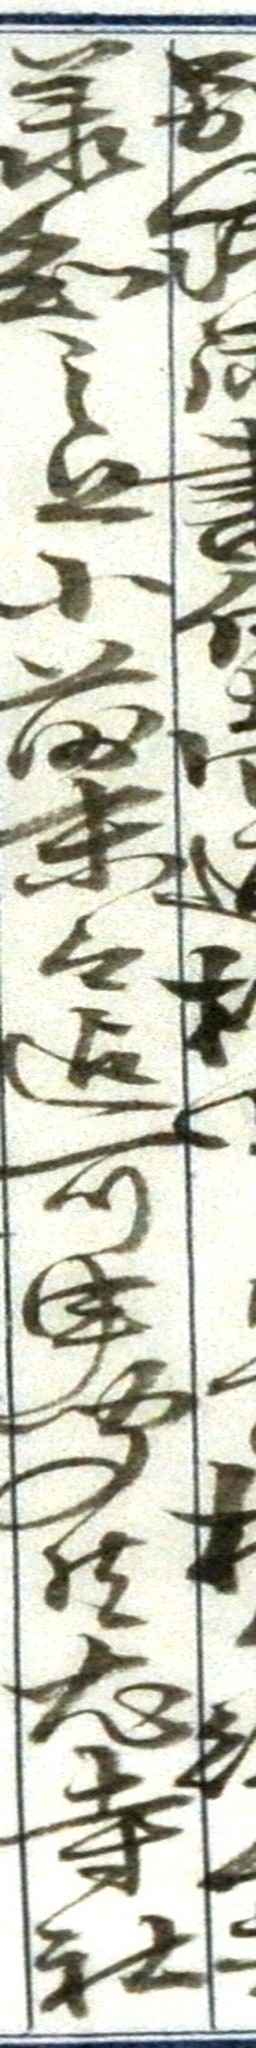承知之上小前末々迄可申聞候尤寺社
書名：潤緩方御触書
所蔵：伊那市立高遠町図書館・合同会社AMANE
